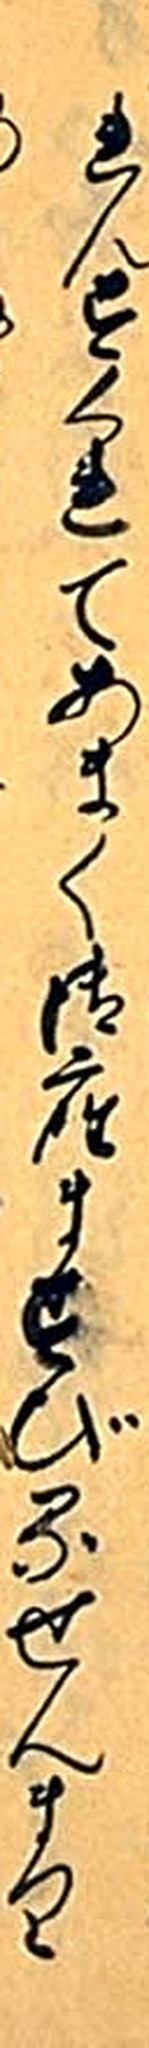れんすくれてあまく御座ますびるせんまり
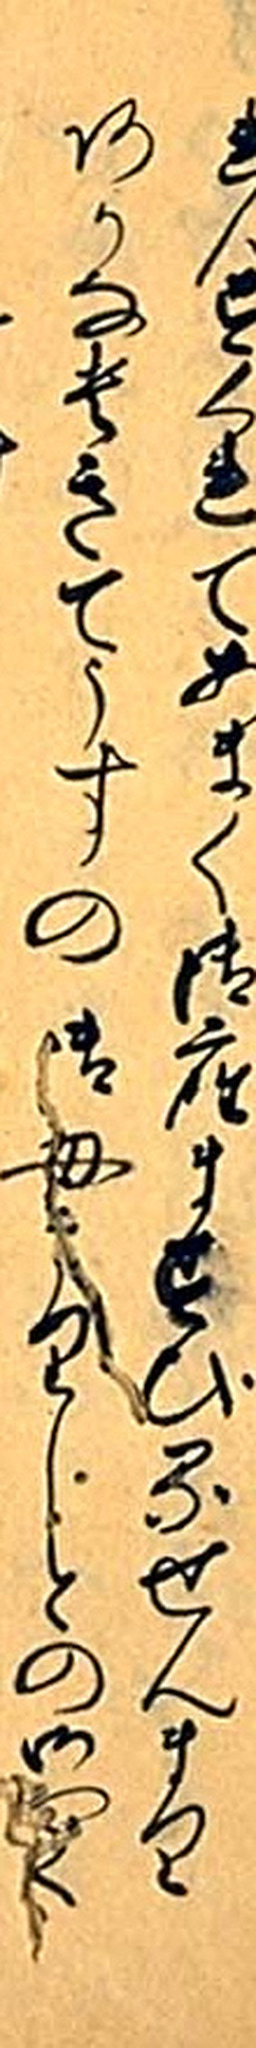あかな貴きてうすの御母りしとの御く
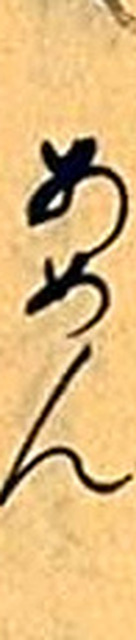あめん
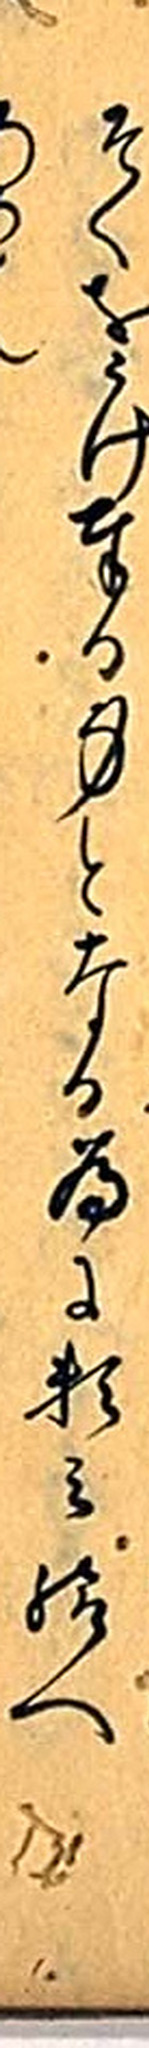そくをうけ奉る身となる為に頼み給へ
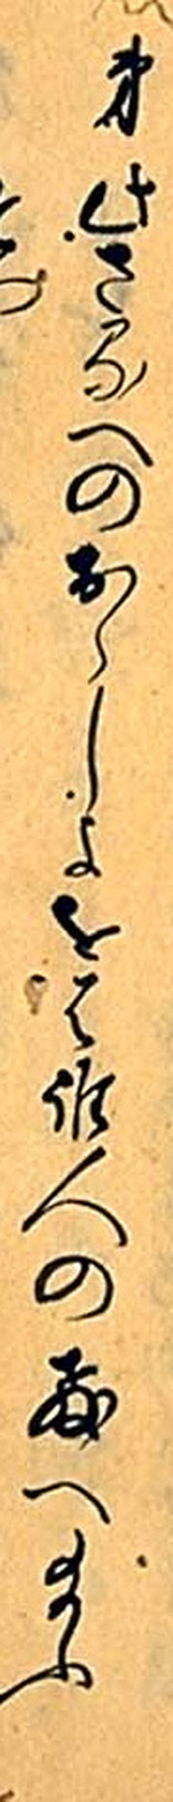弟此さるへのおらしよをは誰人の教へ給ふ
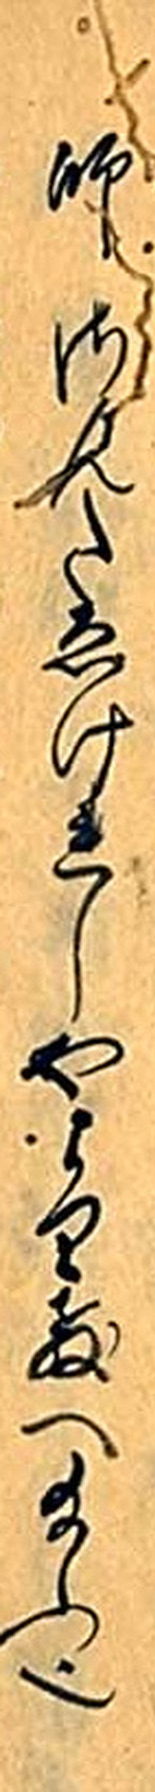師さんたゑけれしやより教へ給ふ也
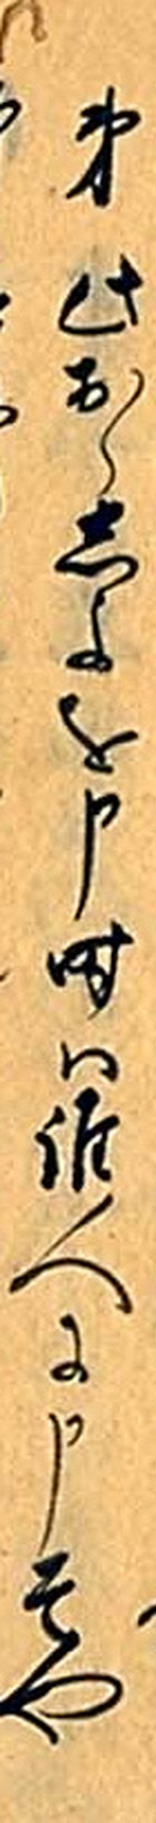弟此おらしよを申時は誰人に申そや
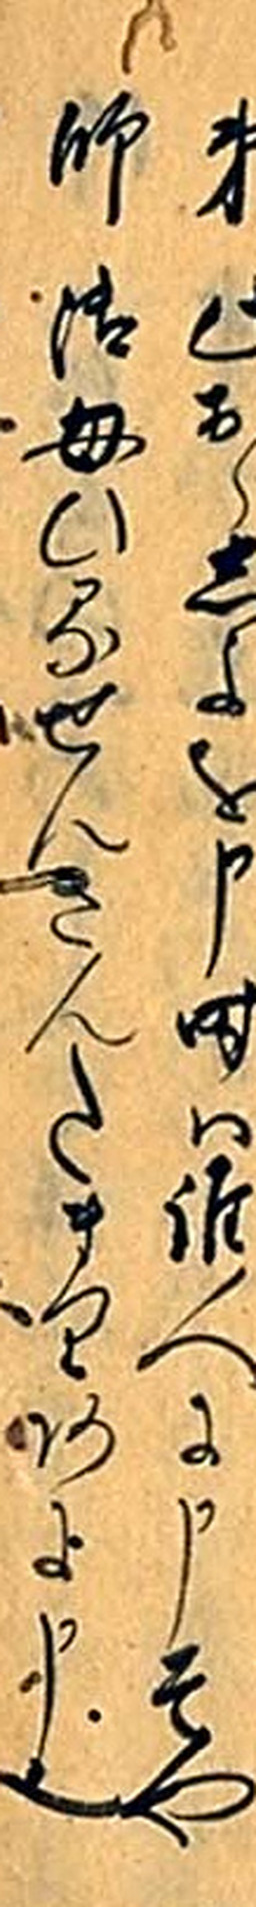師御母ひるせんさんたまりあに申也
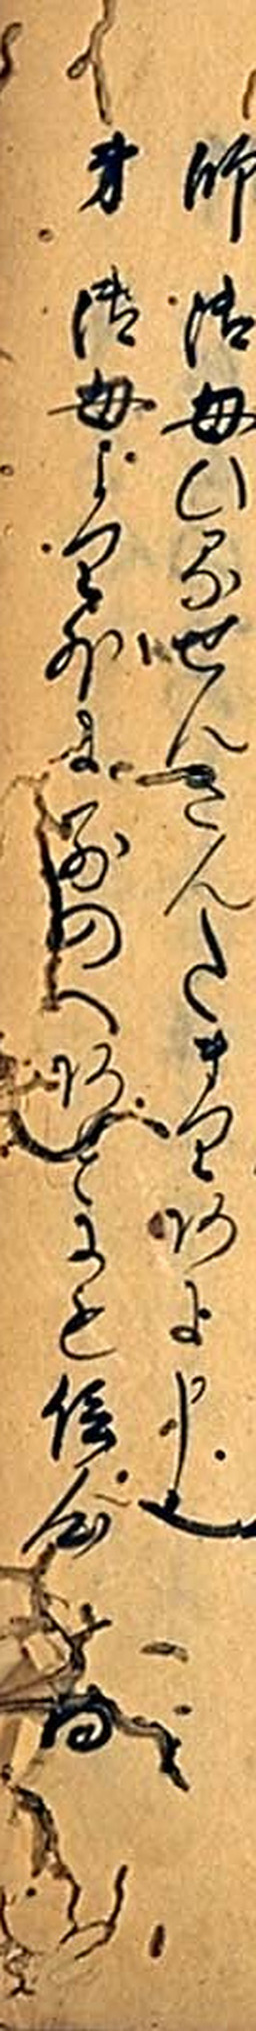弟御母より外に別のへあとにも信心

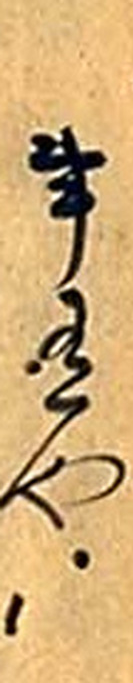事有や
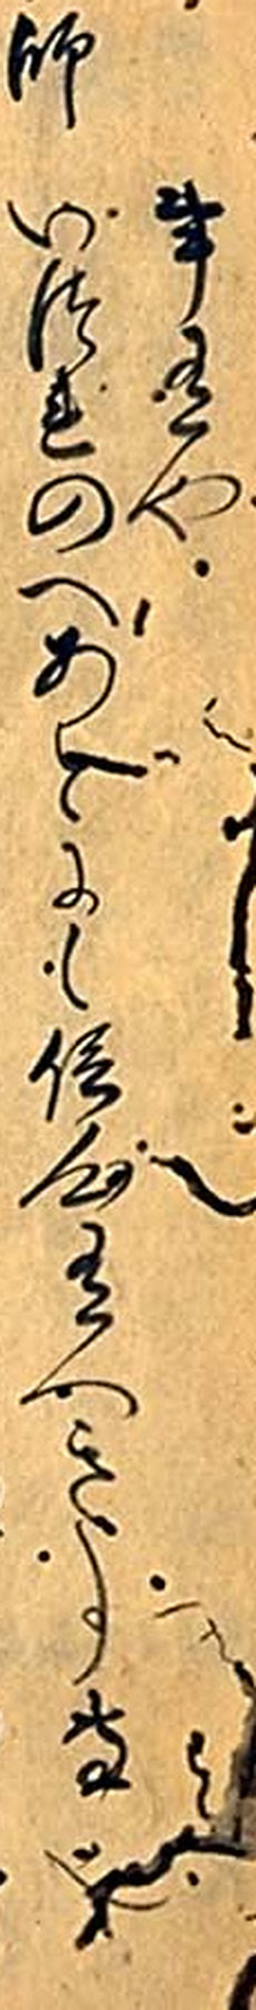師いつれのへあとにも信心有へき事専也
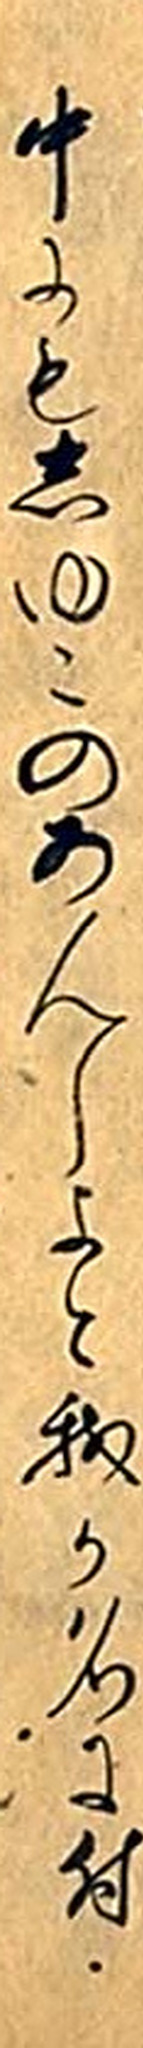中にもしゆこのあんしよと我か名に付
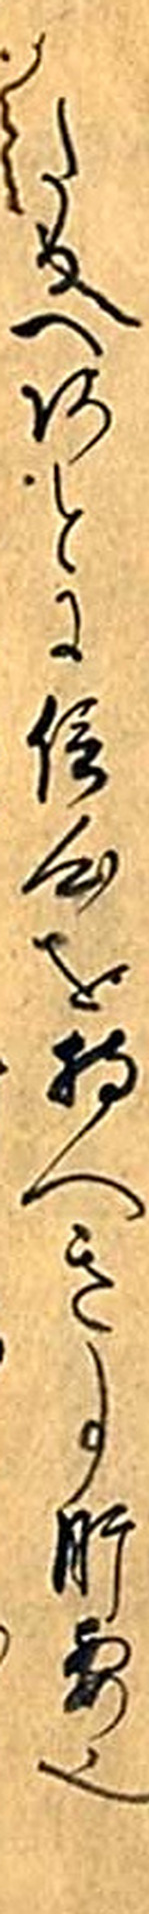たるへあとに信心を持へき事肝要也
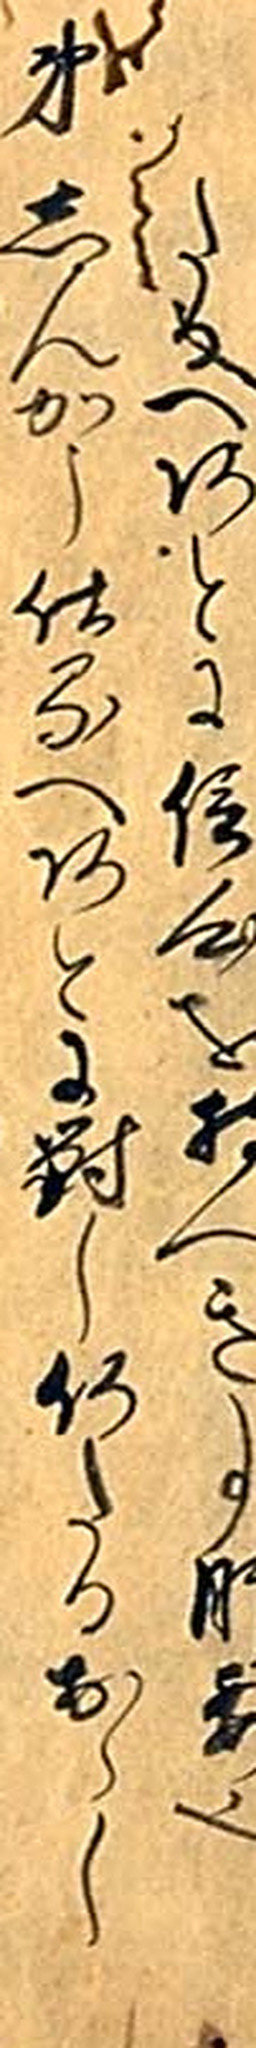弟しんかう仕るへあとに対しあたるおらし
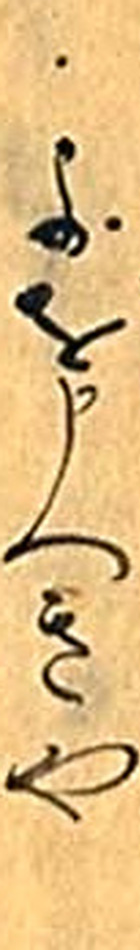よを申へきや
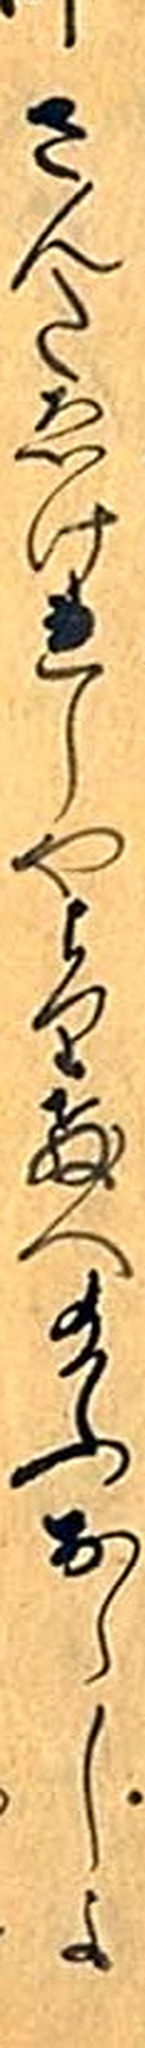師さんたゑけれしやより教へ給ふおらしよ
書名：ドチリナ・キリシタン
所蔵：東京大学総合図書館 / General Library in the University of Tokyo
